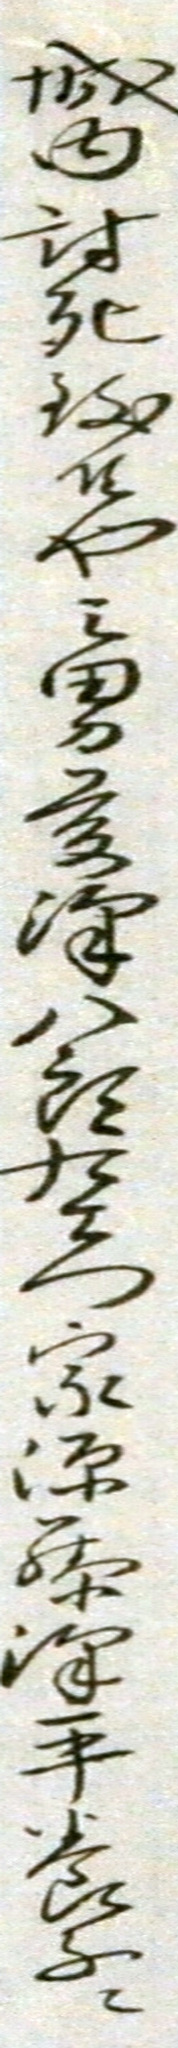城内討死致候也三男藤澤八郎左エ門家源藤澤平養子ニ
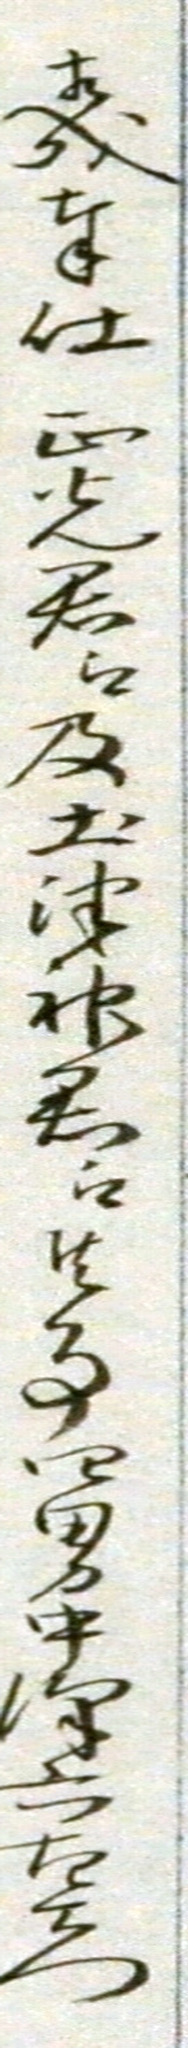相也奉仕正光君江及土津神君江候事四男中澤六左エ門
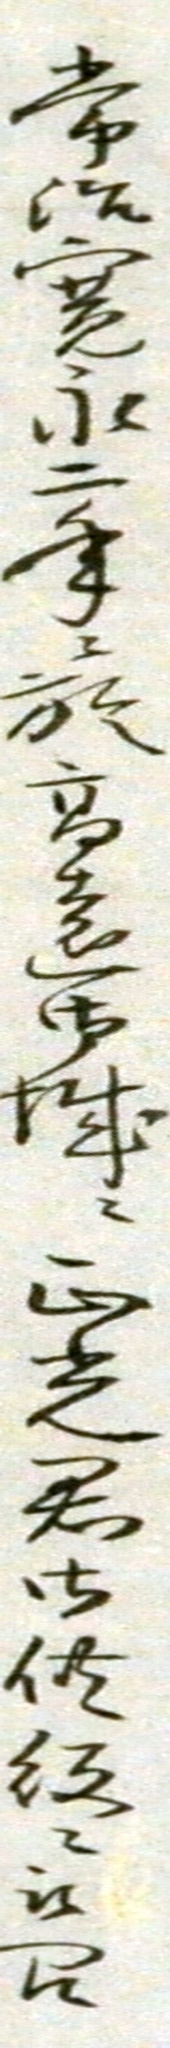常治寛永二年ニ於高遠御城ニ正光君御供役ニ被召
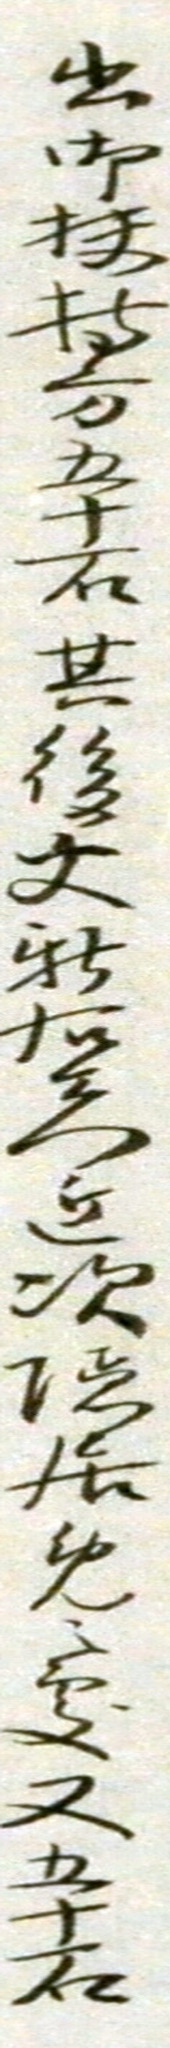出御扶持方五十石其後丈新右エ門近次隠居免之処又五十石
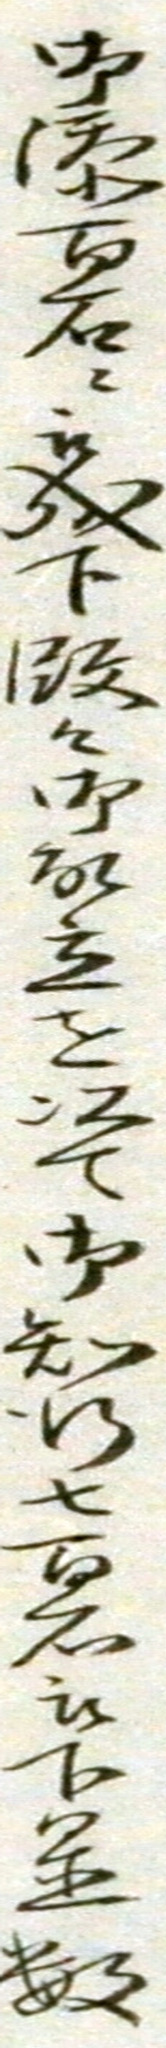御添百石ニ被成下段々御取立を以て御知行七百石被下置数
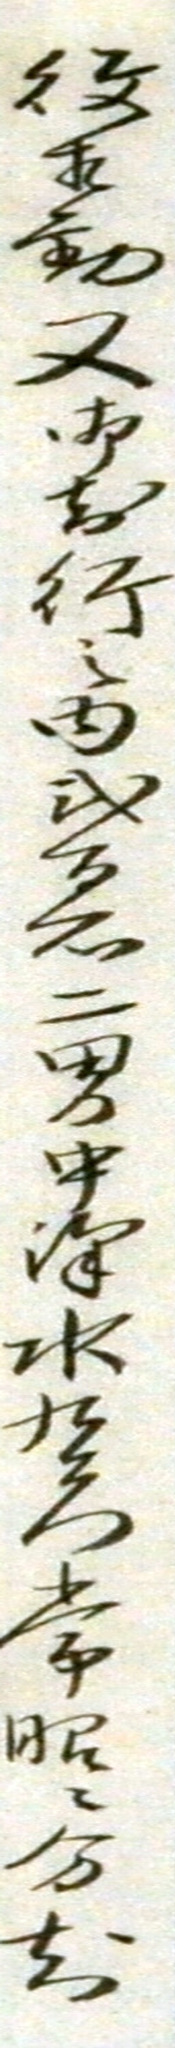役相勤又御知行之内弐百石二男中澤水右エ門常服ニ分知
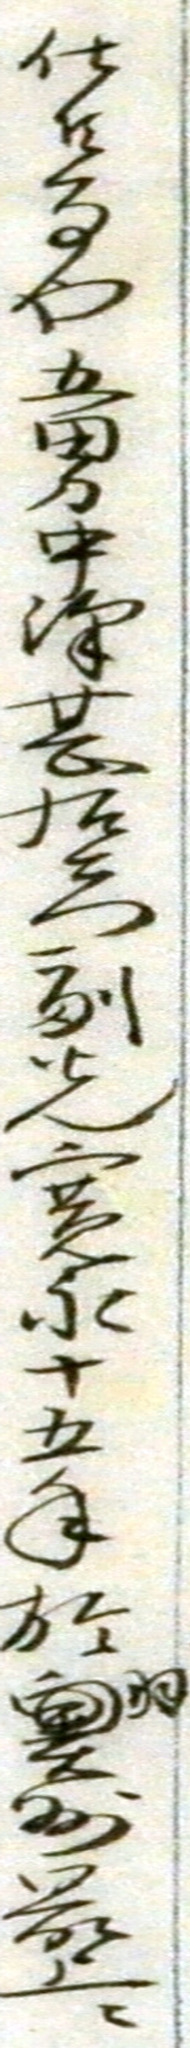仕候る也五男中澤甚右エ門副光寛永十五年於奥羽州最上ニ
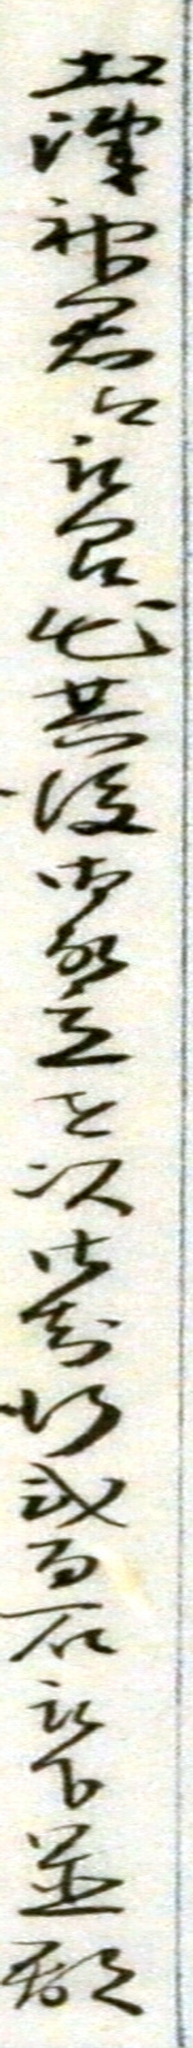土津神君江被召出共後御取立を以御知行弐百石被下置郡
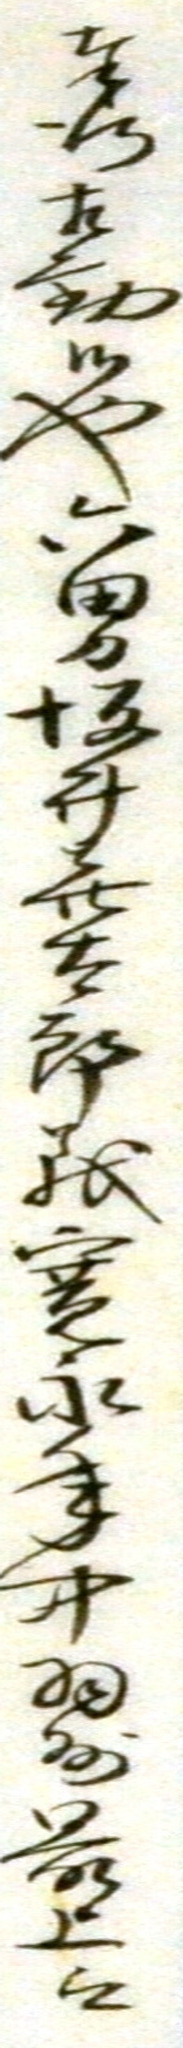奉行相勤候也六男坂井弁太郎義寛永年中羽州最上江
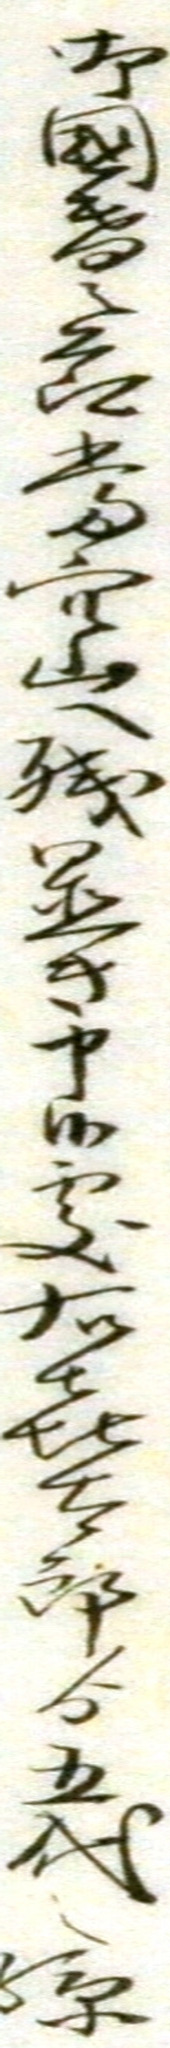御国暮之節当穴山へ残置き申候処右喜太郎ゟ五代之孫
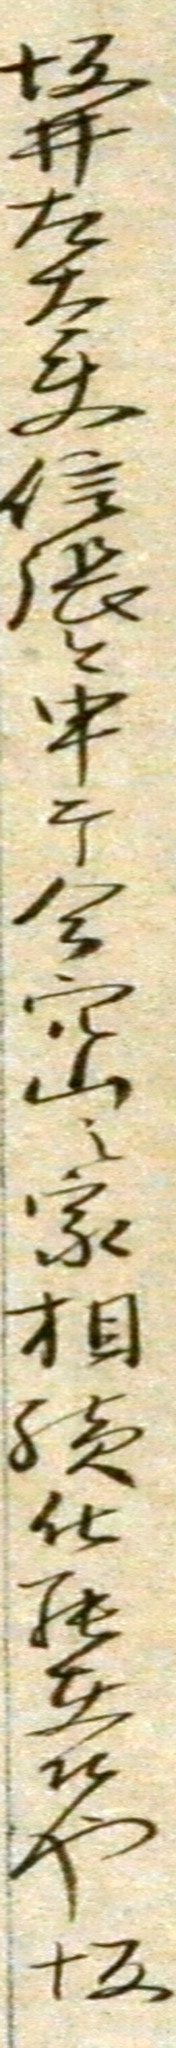坂井左太夫信張と申テ同穴山之家相続仕罷在候也坂
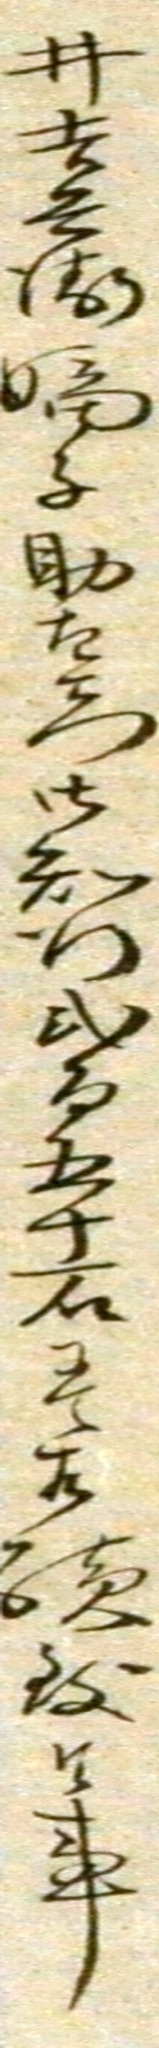井吉兵衛嫡子助左エ門御知行弐百五十石にて相続致候事
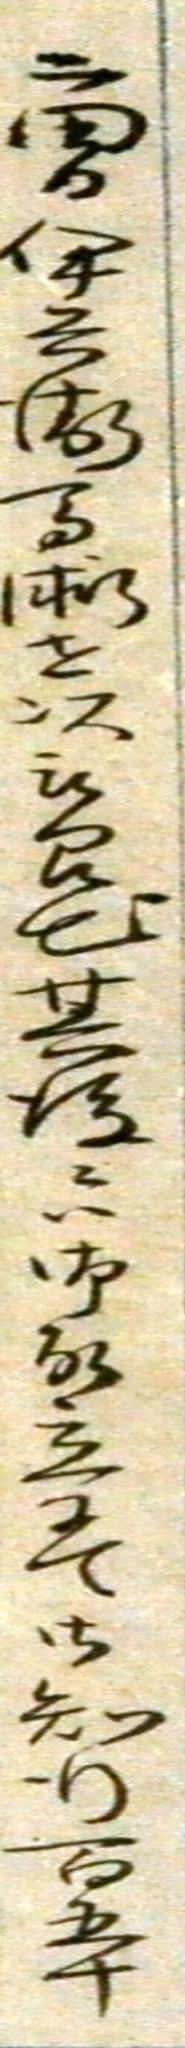二男伊兵衛馬術を以被召出其後ニハ御取立にて御知行百五十
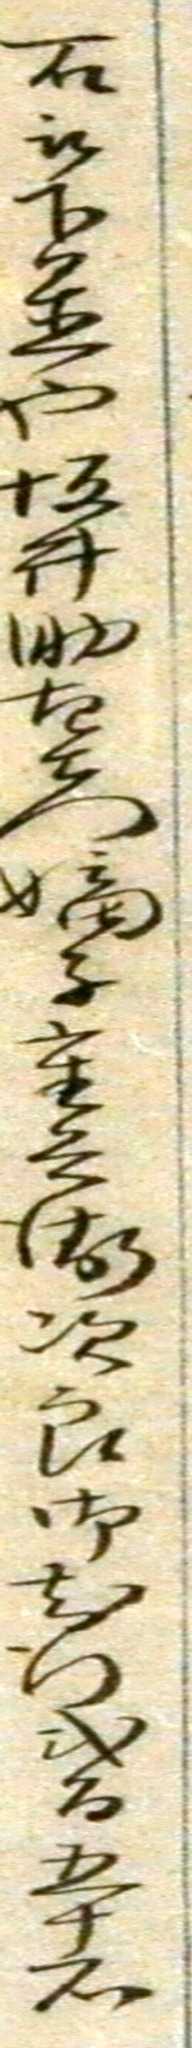石被下置也坂井助左エ門嫡子重兵衛次郎御知行弐百五十石
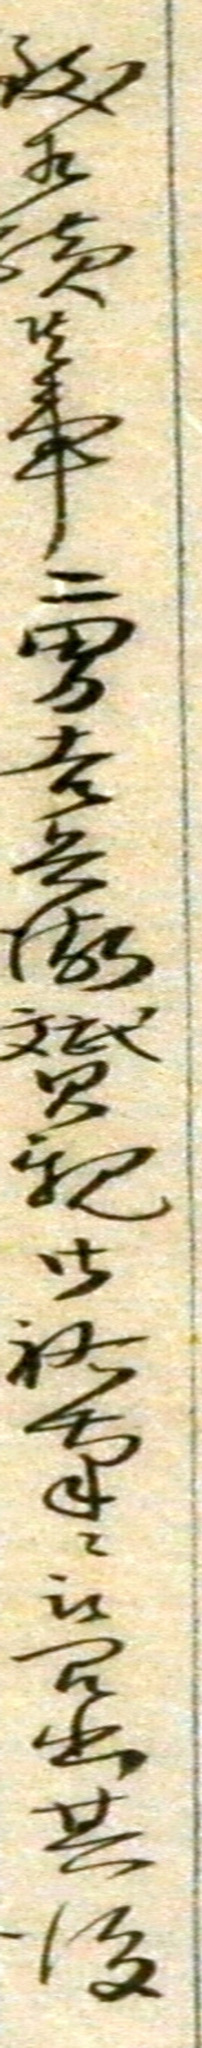致相続候事二男吉兵衛贇親御祐筆ニ被召出其後
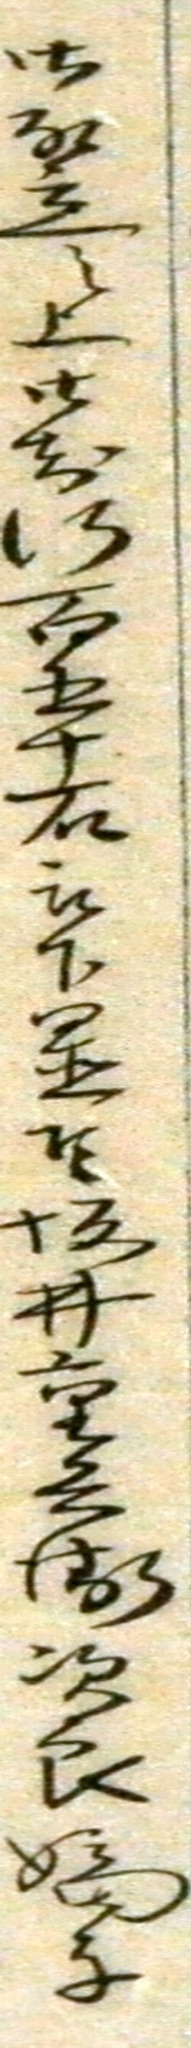御取立之上御知行百五十石被下置候坂井重兵衛次良嫡子
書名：三好氏先代以来勤仕録、池田丈介一家勤仕録
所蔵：伊那市立高遠町図書館・合同会社AMANE
